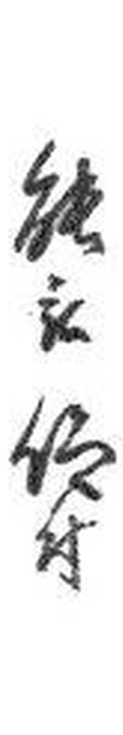能被仰付
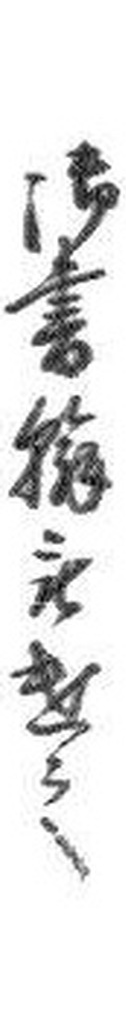御書翰被遣之
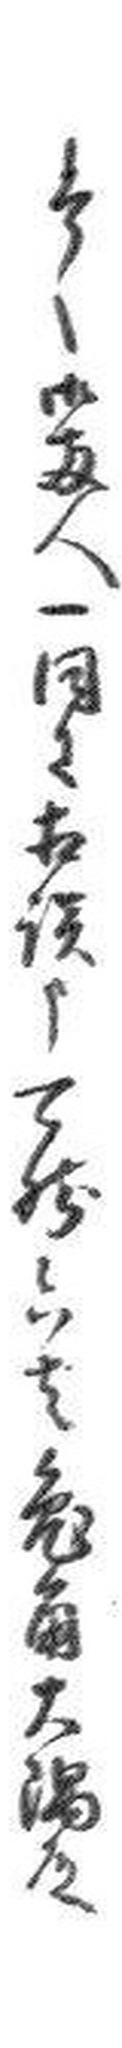尚々御両人一同に相談申可然候ハ者兎角大隅殿
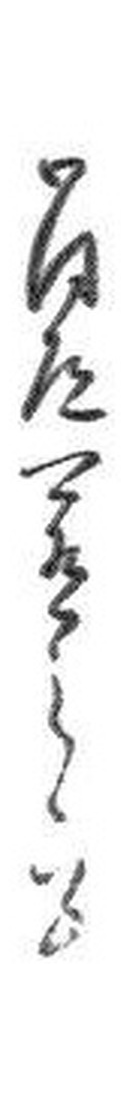御同道可有之候以上
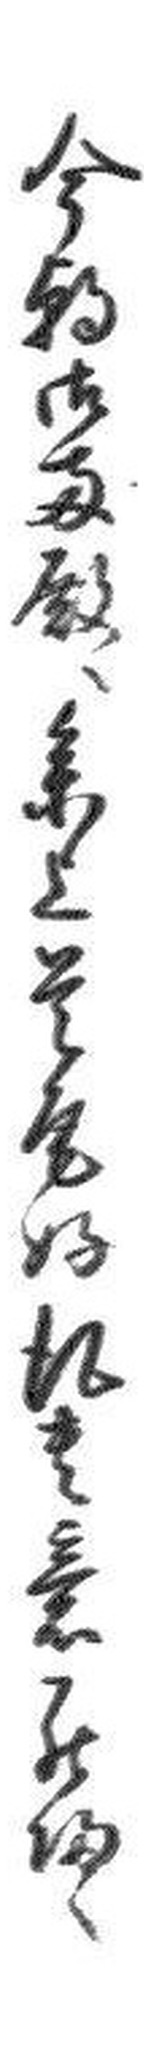今朝御両殿ヘ参上首尾好得貴意罷帰候
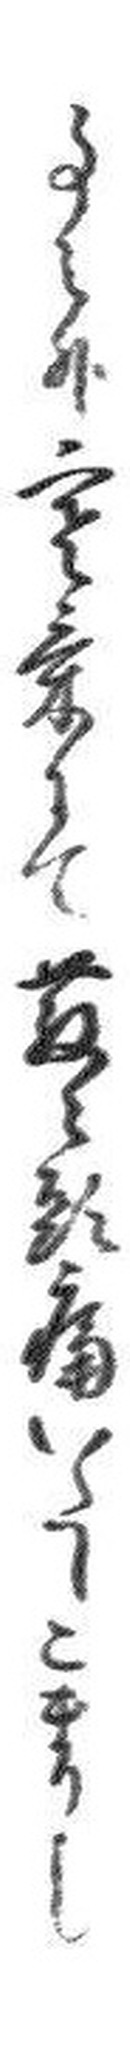事之外寒気にて散々頭痛いたしこまり申候
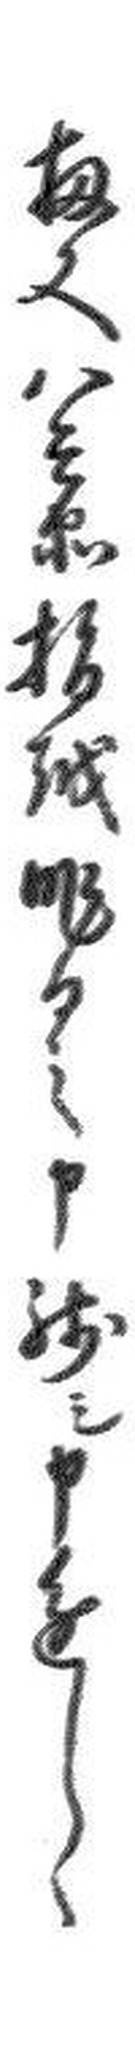扨又八兵衛指越昨日之申残シ申進し候
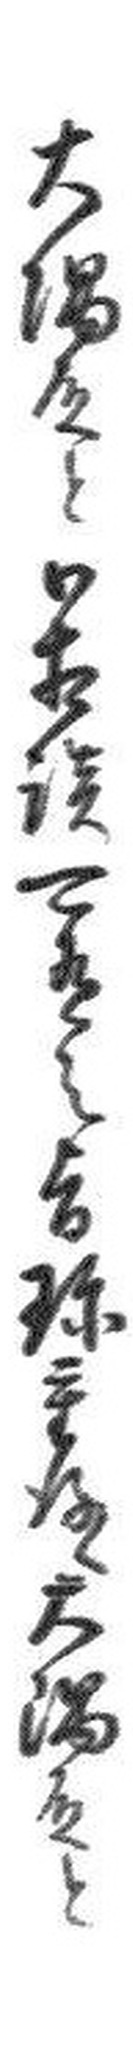大隅殿と御相談可有之旨珍重存候大隅殿と
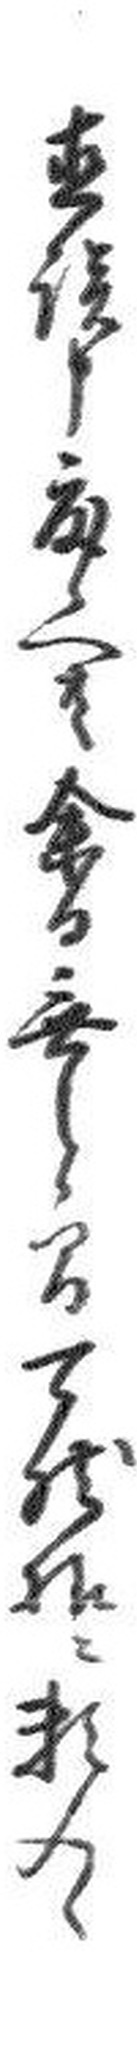直談申度候ヘ共余日無之候間可然様ニ頼入候
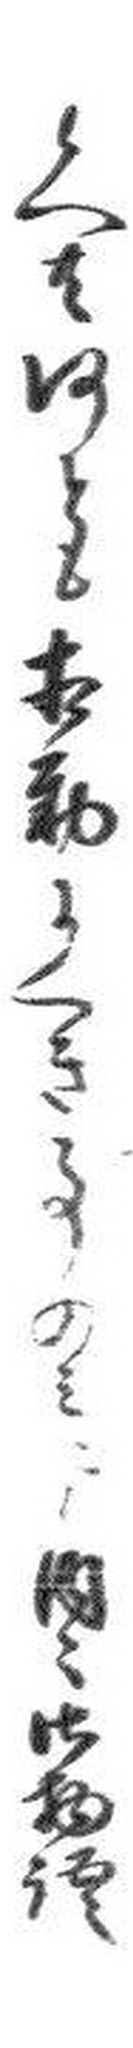候ヘ共何とも相勤にくき事のミニ候内々御物語
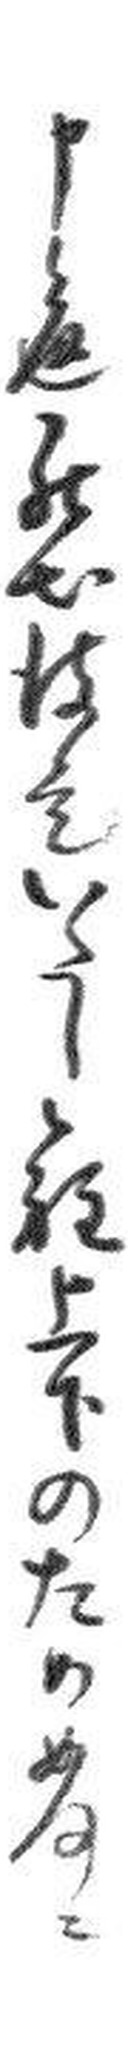申候通罷出彼是いたし候程上下のため如何ニ

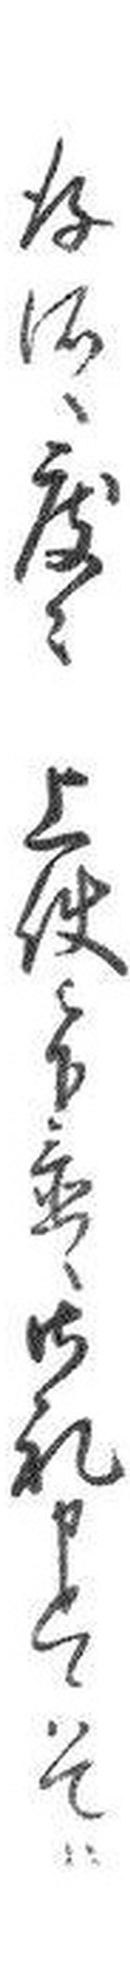存所ヘ度々上使被下置候御礼申上候ハてハ
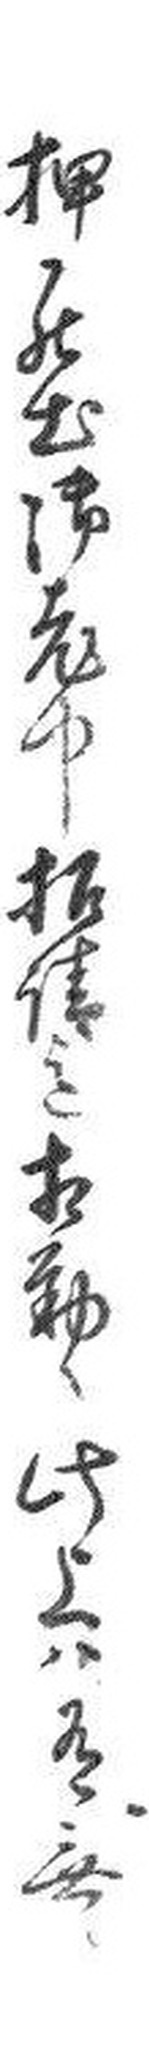押罷出御老中招請迄相勤候此上ハ有無ノ
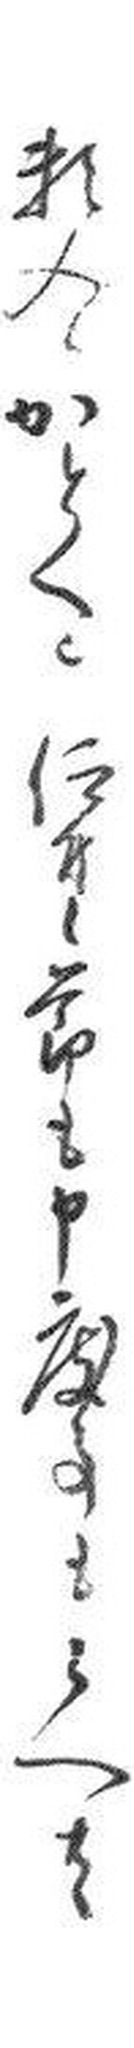頼入候かとく被仰付候節も申度事も候へ共
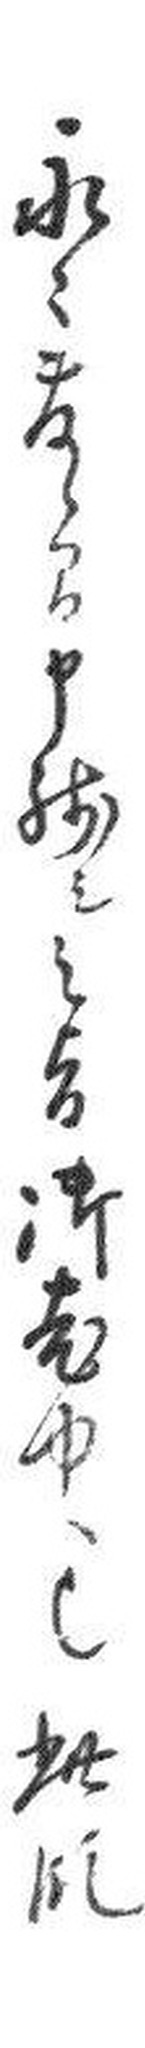永々敷候間申残シ之旨御老中ヘ申候此段
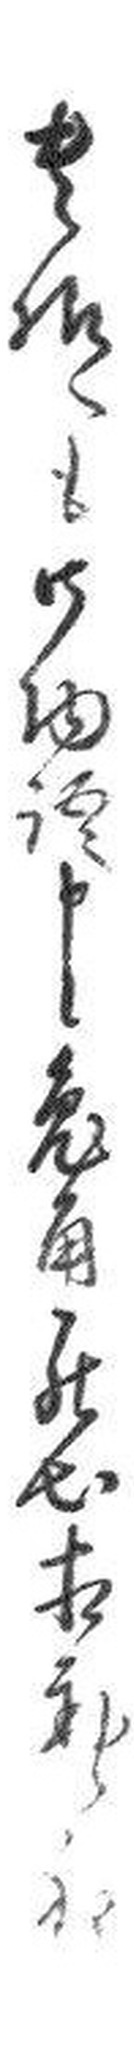貴様ヘも御物語申候兎角罷出相勤候程
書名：家譜 十一 昌親公 従延宝二年到延宝四年八月
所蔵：福井県文書館 Fukui Prefectural Archives
